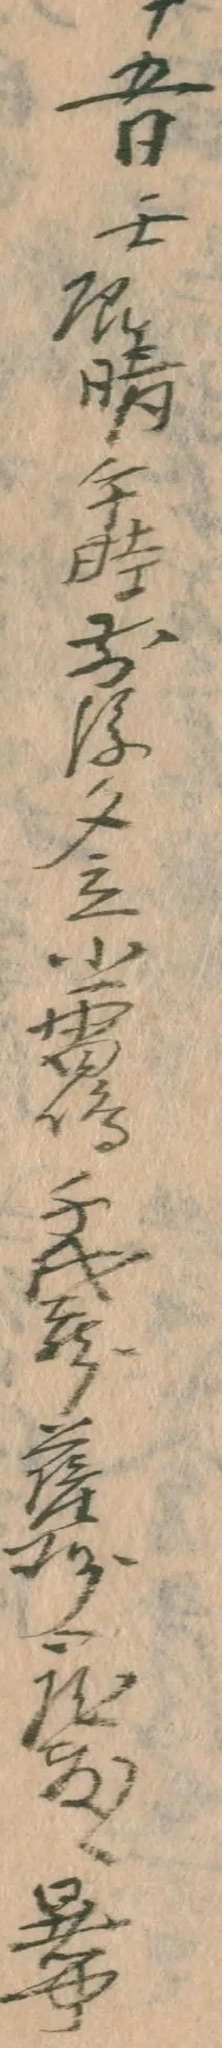十五日壬辰晴午時前後夕立小雷鳴千代蔵薩州御屋敷へ暑中
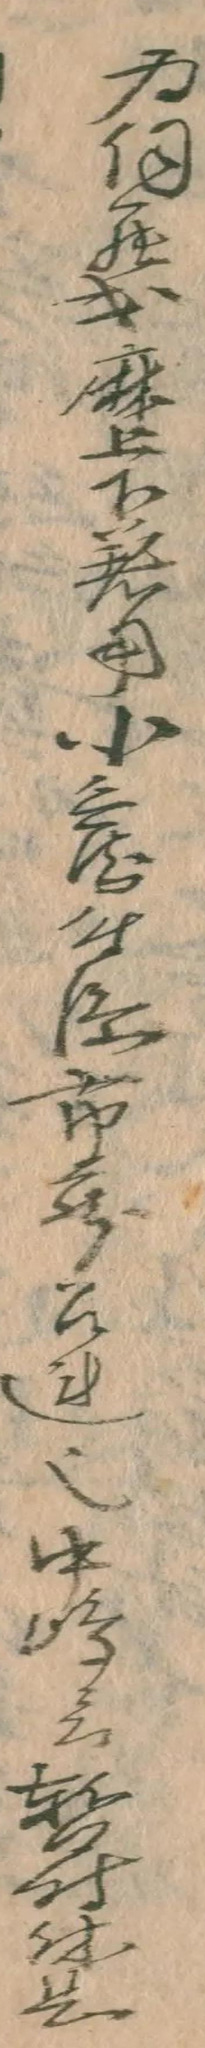為伺罷出麻上下着用小兵衛付添市蔵召連也中嶋ニ而暫時休息
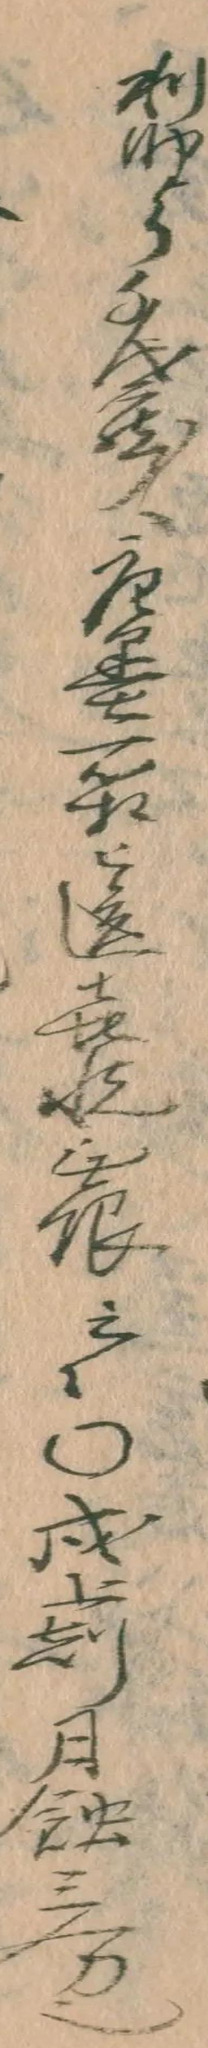利助より手代蔵へ唐墨一箱被送喜悦無限云々〇戌上刻月蝕三分也
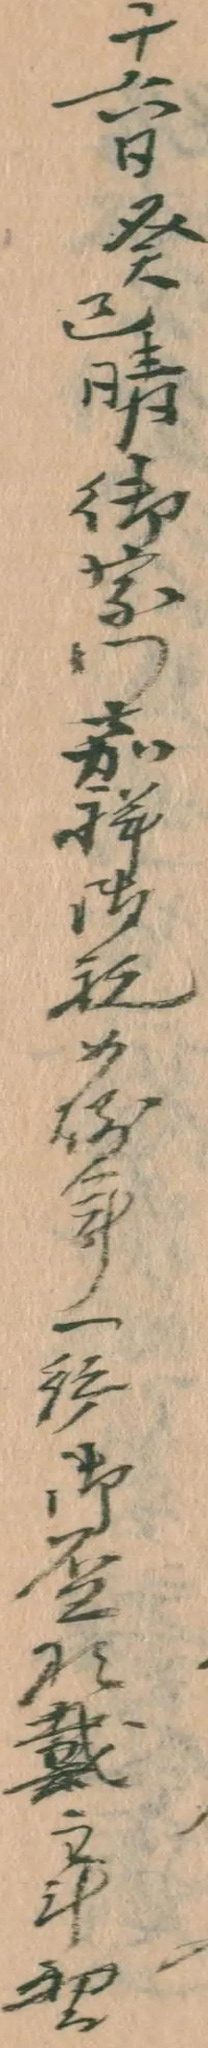十六日癸巳晴御家門嘉祥御祝如例年一統御盃頂戴主計初而
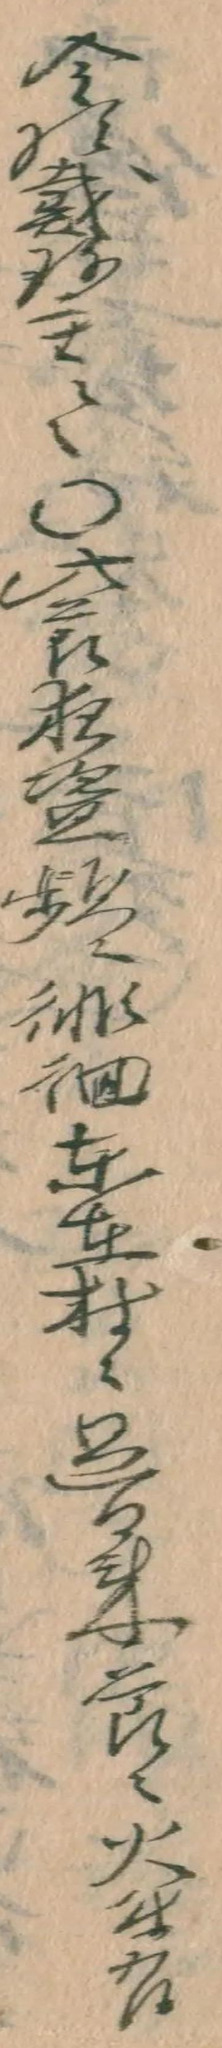金頂戴珍重〻〻〇此節夜盗頻ニ徘徊東在村〻過日来節々火付有
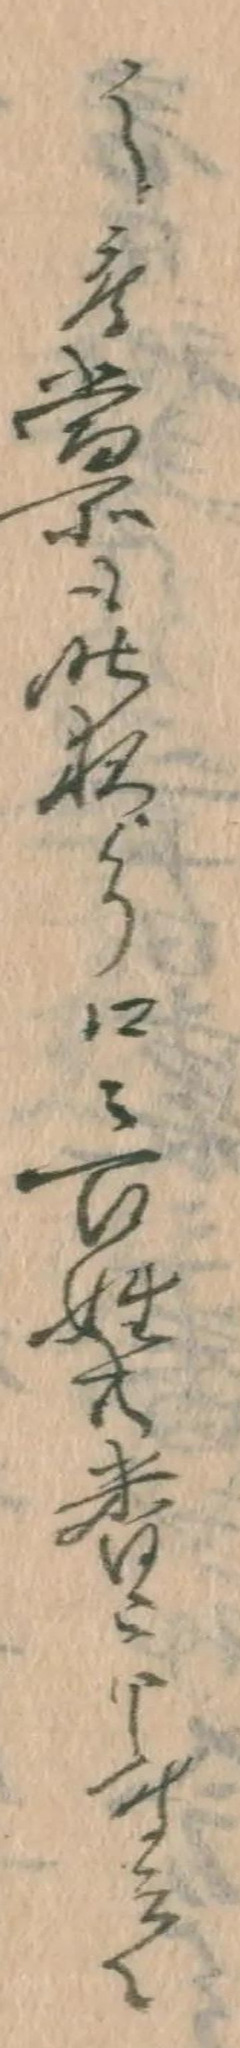之ニ付當所も昨夜より口〻百姓共番被申付云々
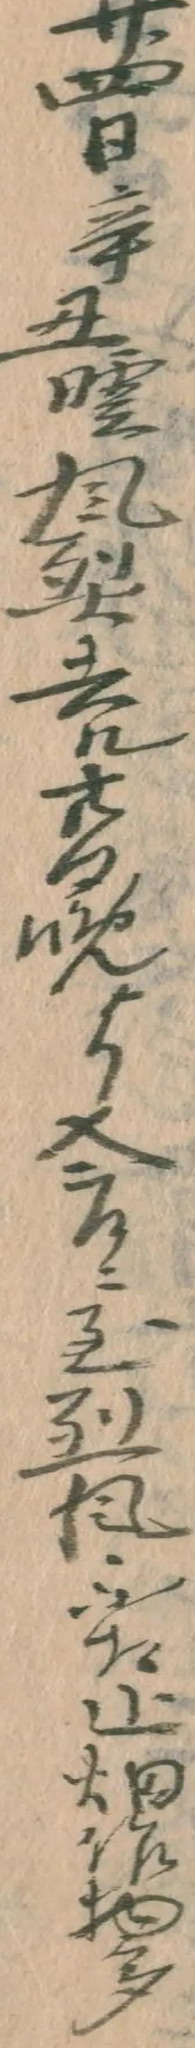廿四日辛丑曇風烈去ル廿日晩より今日ニ至烈風不相止畑作物多
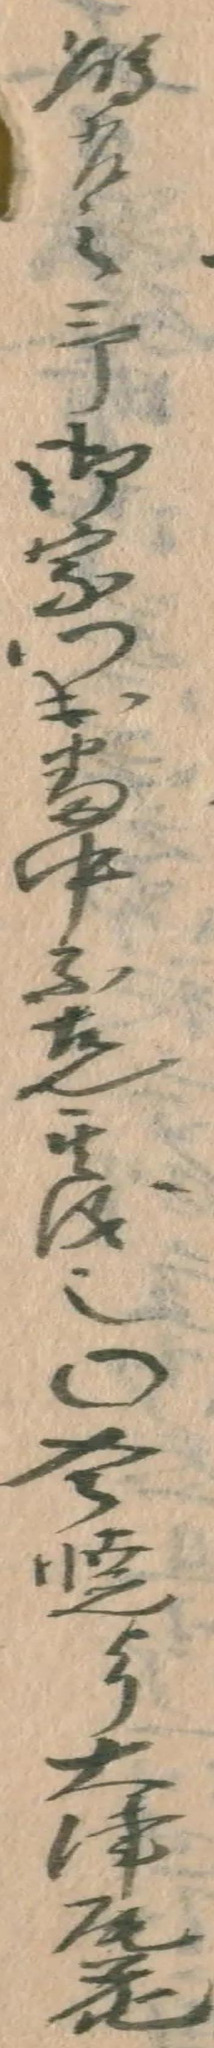觸有之予御家門出番中不克其儀也○今暁より大津尾花
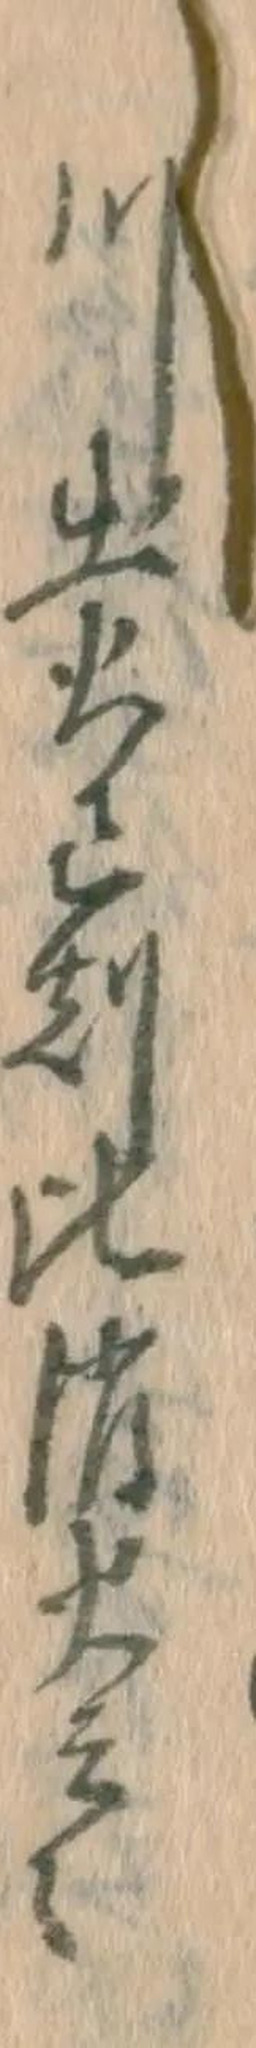川出火巳刻比消火云〻
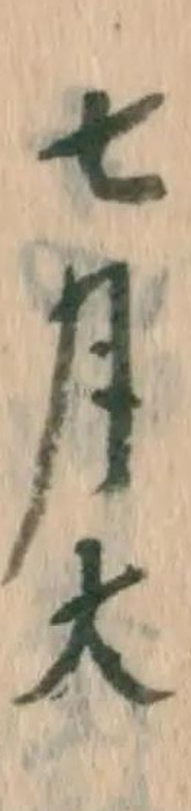七月大
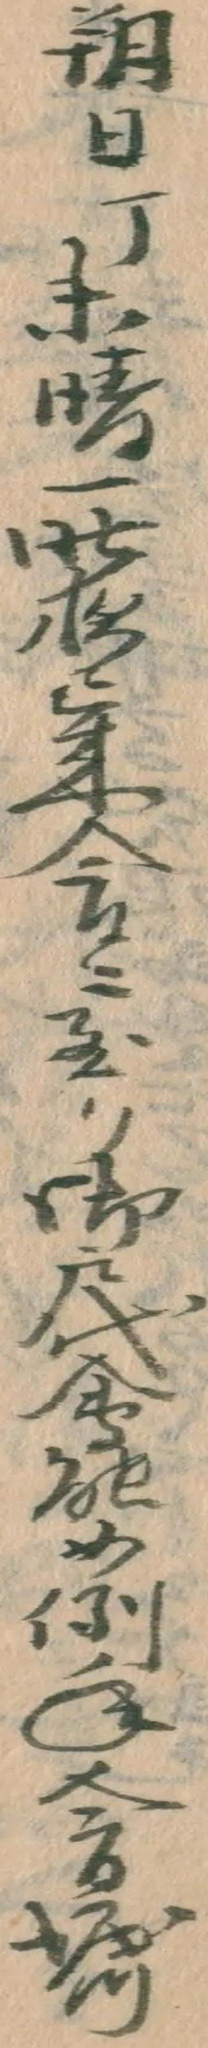朔日丁未晴一昨夜已来今日ニ至り御戸代會能如例年今日堀川
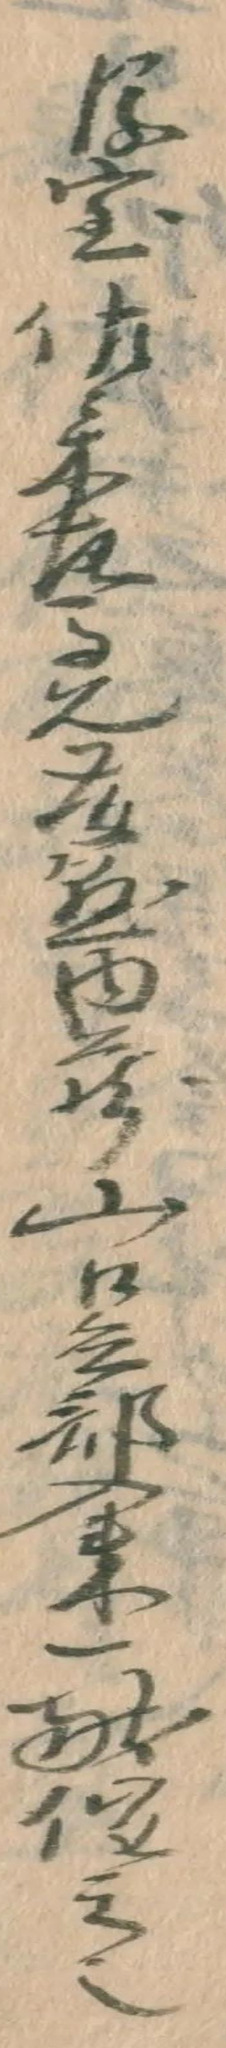後室佐々木左馬允藤懸内蔵山口兵部入来一献催之也
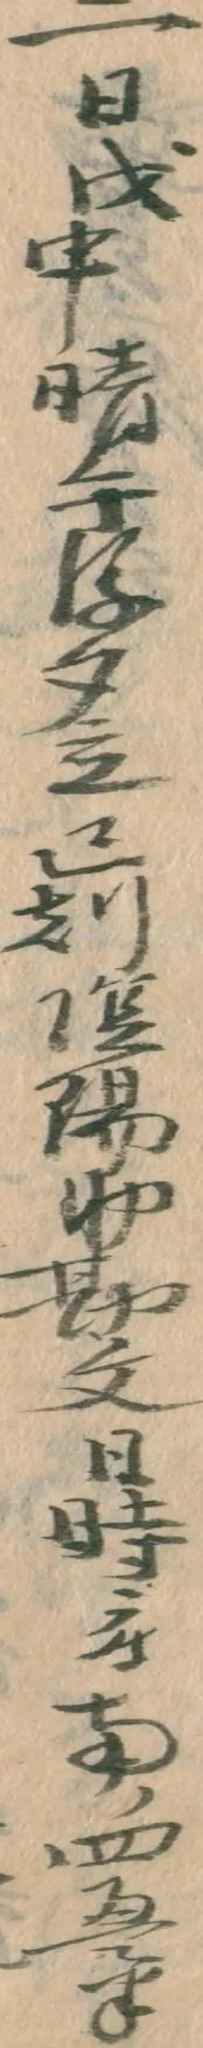二日戊申晴午後夕立巳刻陰陽助勘文日時ニ付南ノ四畳半
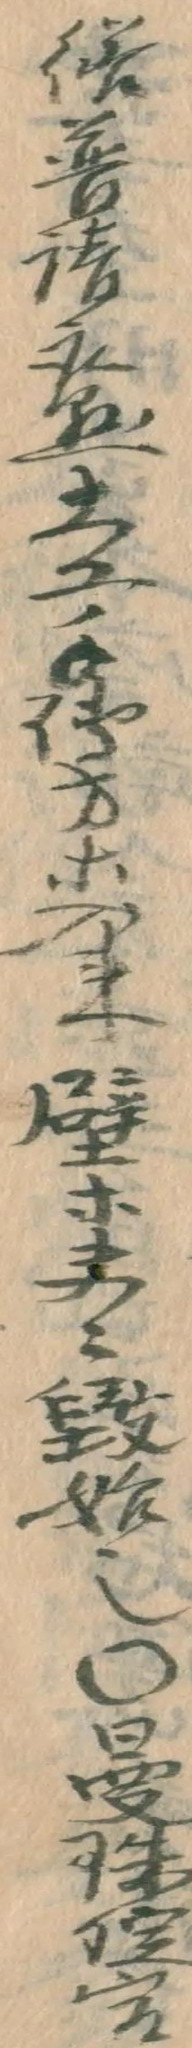繕普請取懸大工手傳方等入来壁等夫〻毀始也○曼珠院宮

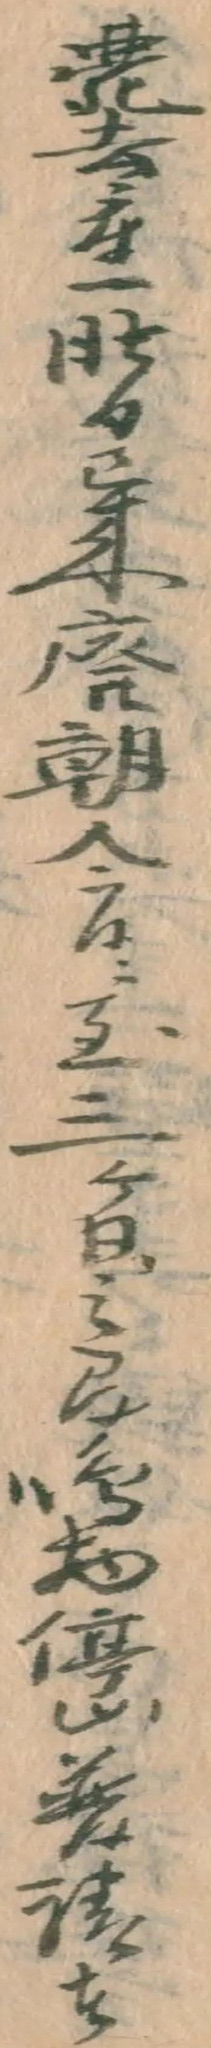薨去ニ付一昨日已来廃朝今日ニ至三ケ日之間鳴物停止普請者
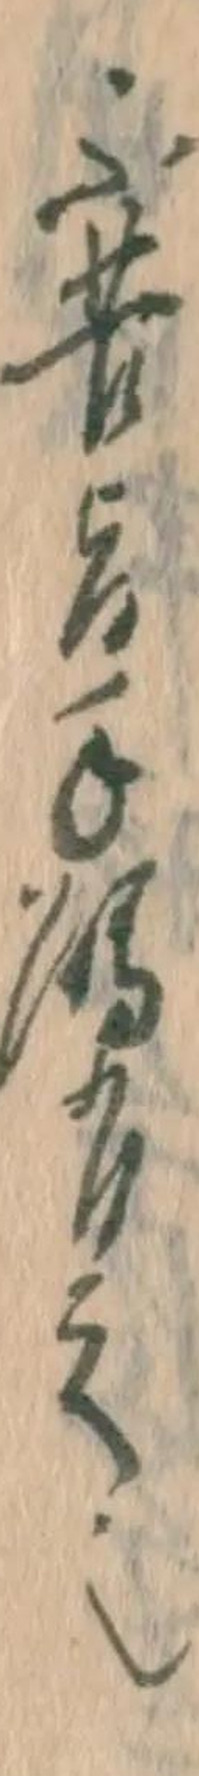不苦旨手觸有之也
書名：賀茂社記録. 第69冊
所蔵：国立国会図書館 National Diet Library, JAPAN
